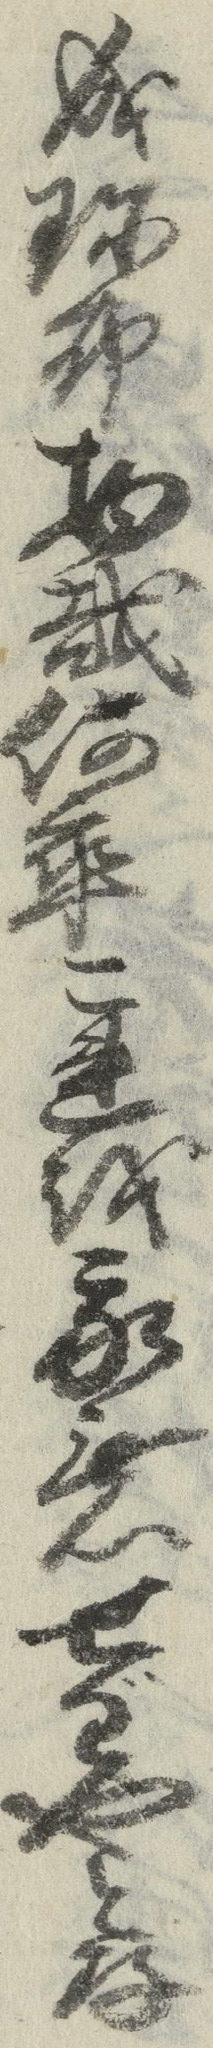成弥布物哉何卒これを我無心せがやと存
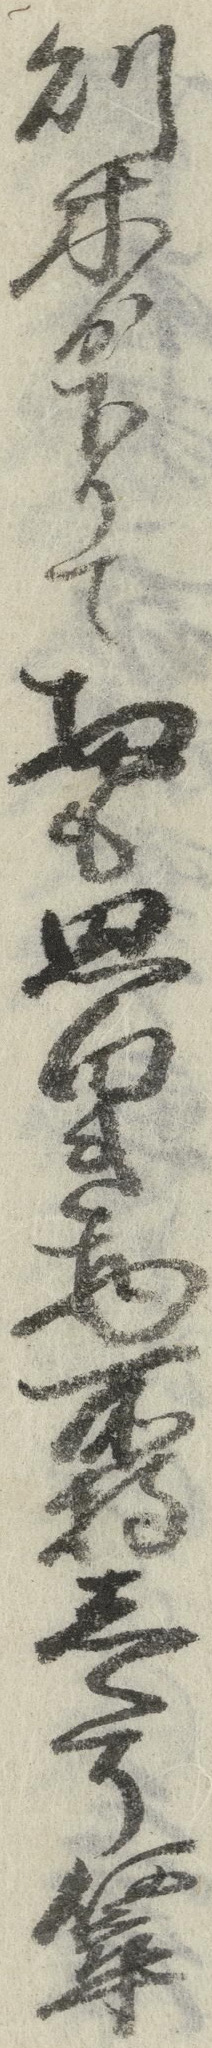則木ゟ下りて扨も思白き物所持したり何卒
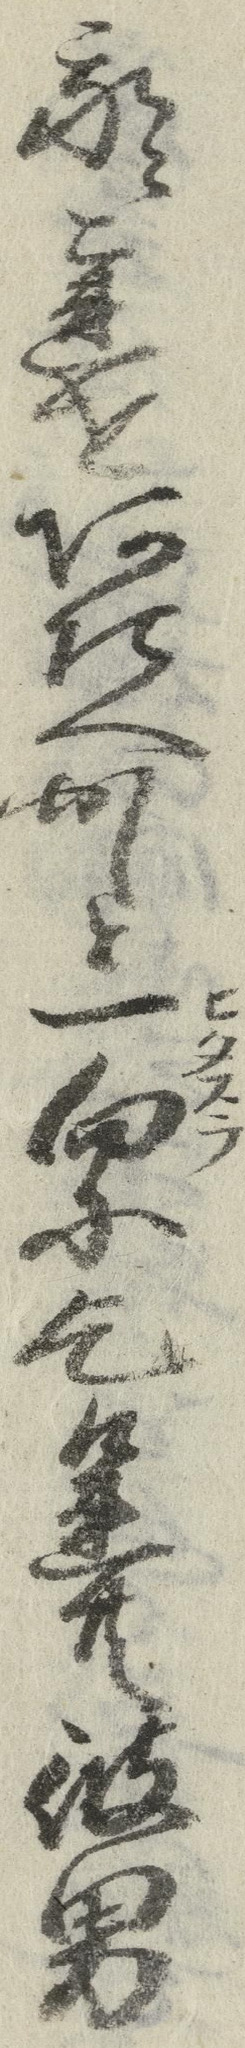我々これ懸あたへかしと一向に乞けれ共彼男
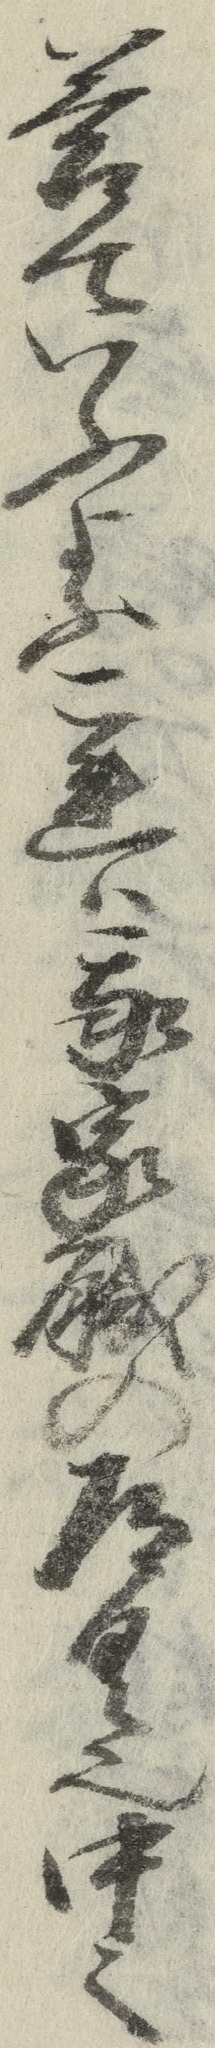答ていふよふこれは我家職の道具也中々
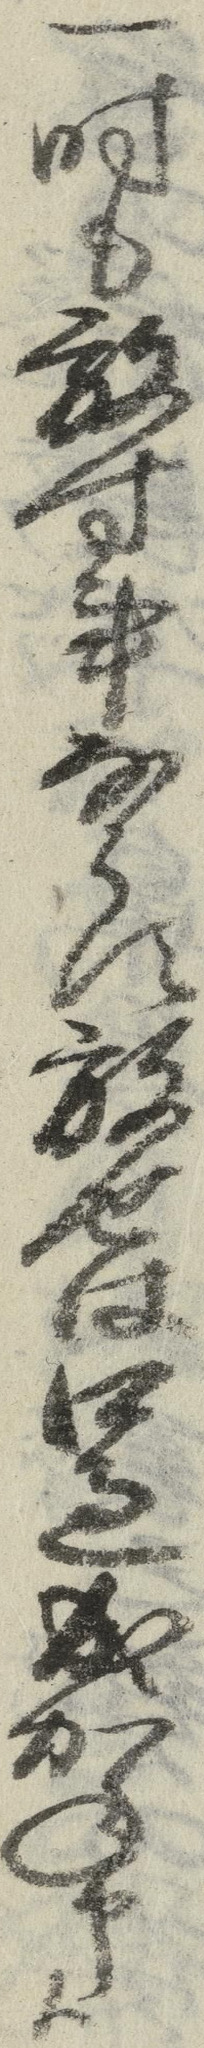一時も放す事ならす放せは口過成かね申候
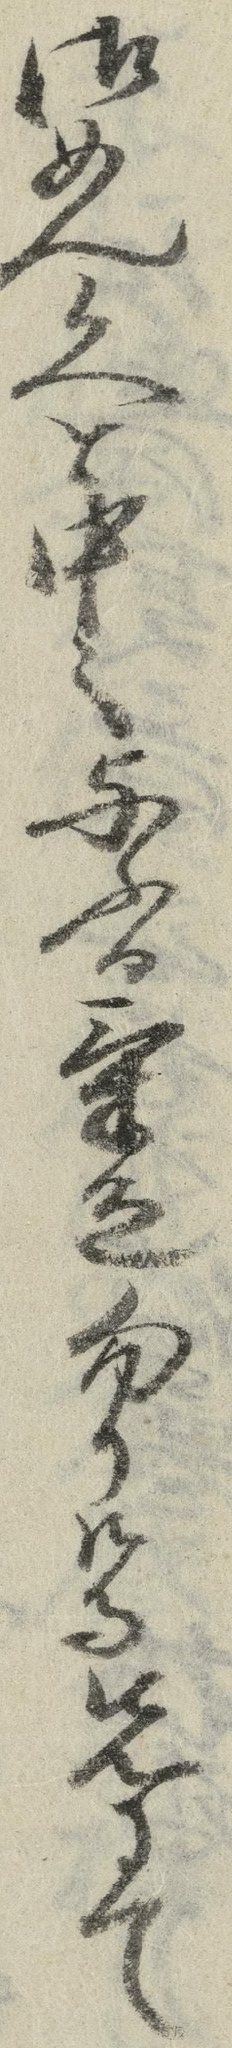御めん候へと中々与ふる気色勿りける先にて
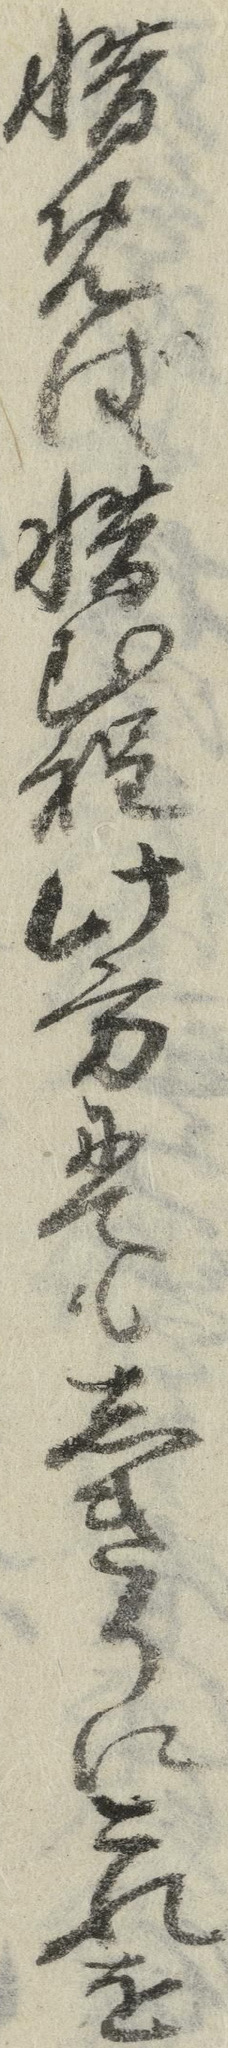惜めば惜む程此方にてもしきりにこれを
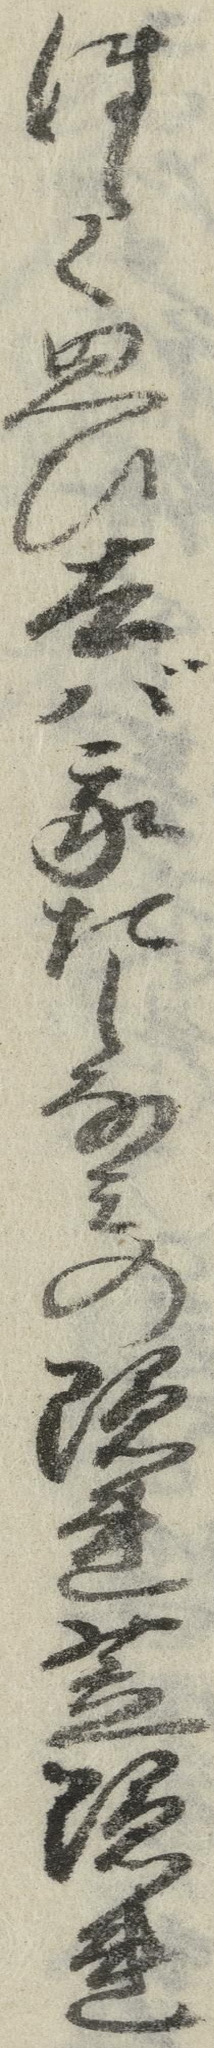ほしく思ひ去は我たしなみの隠れ笠隠れ
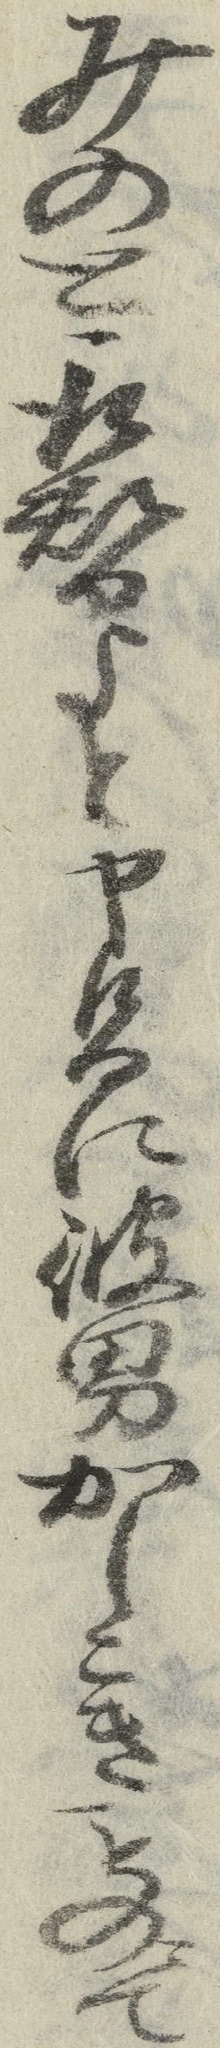みのと取替よと申けるに彼男かしこきものにて
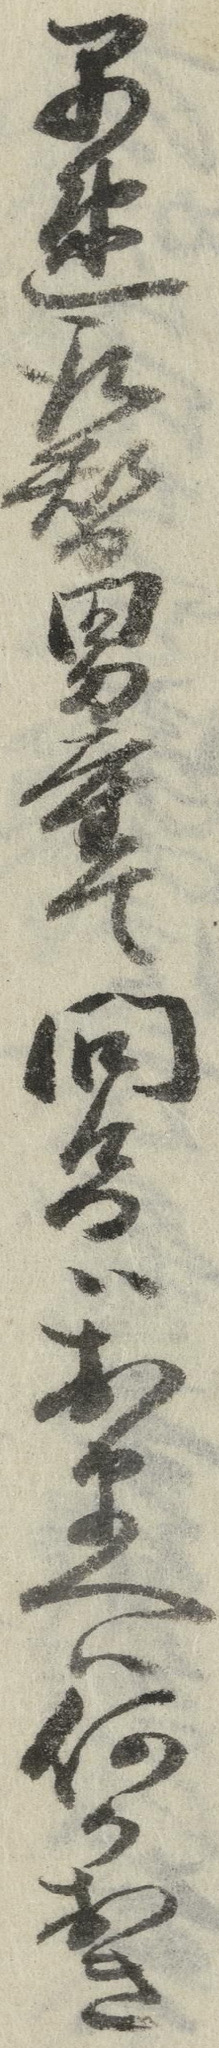早速取替男重て問けるはおまへは何かおき
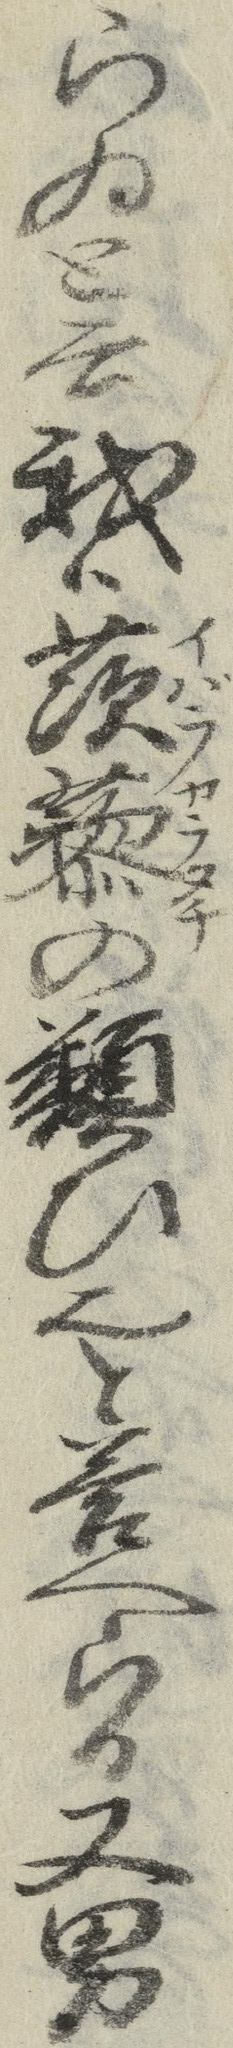らゐと云我は茨藜の類ひ也と答へらる又男
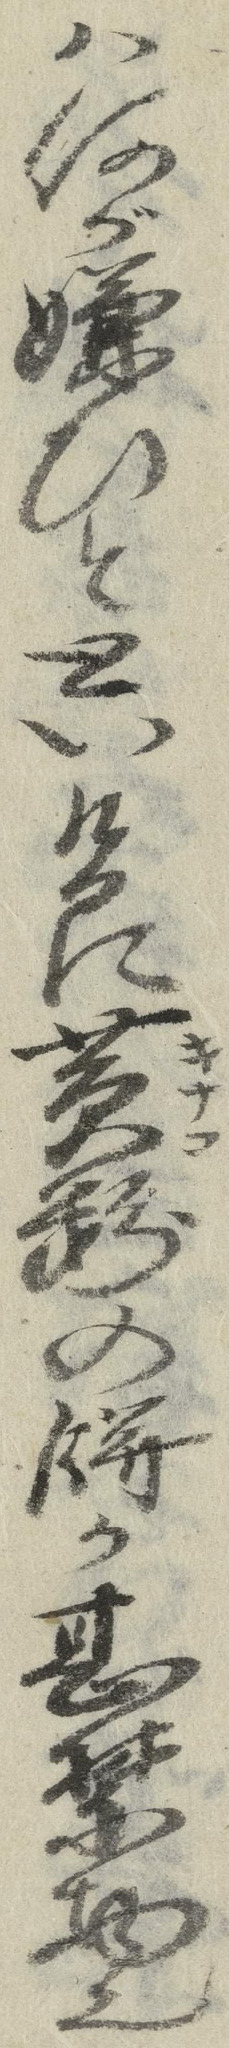は何が嫌ひとといけるに黄粉の餅か甚禁物也
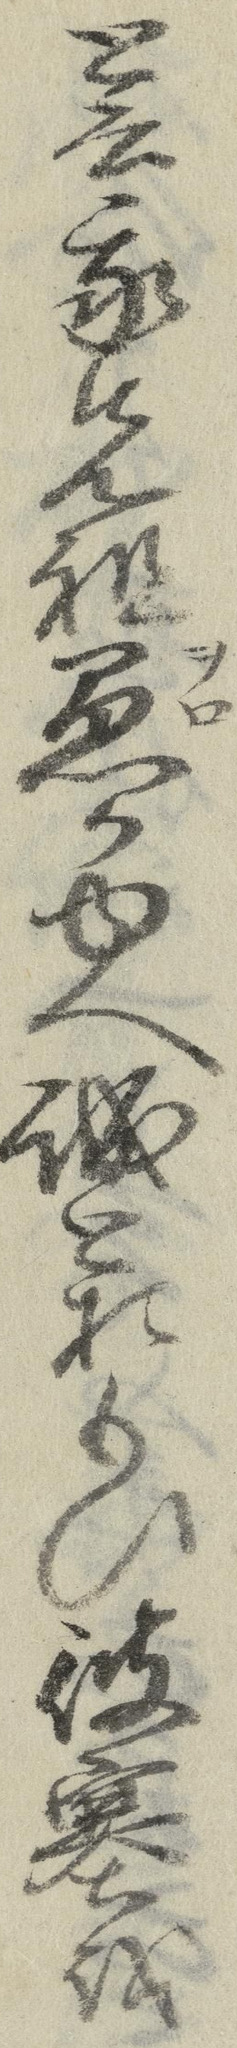と云我先祖愚かゆへ誠とおもひ彼塞を

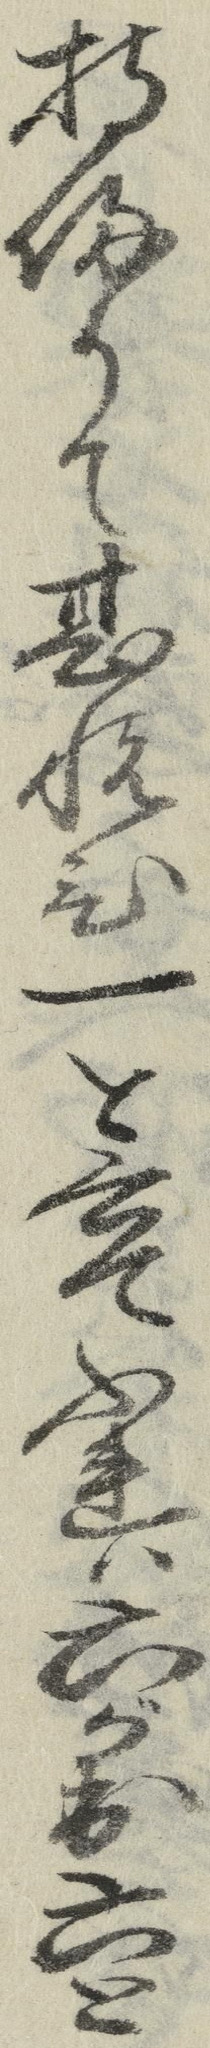持帰りて甚悦ひ一と云てふれは六が出六と
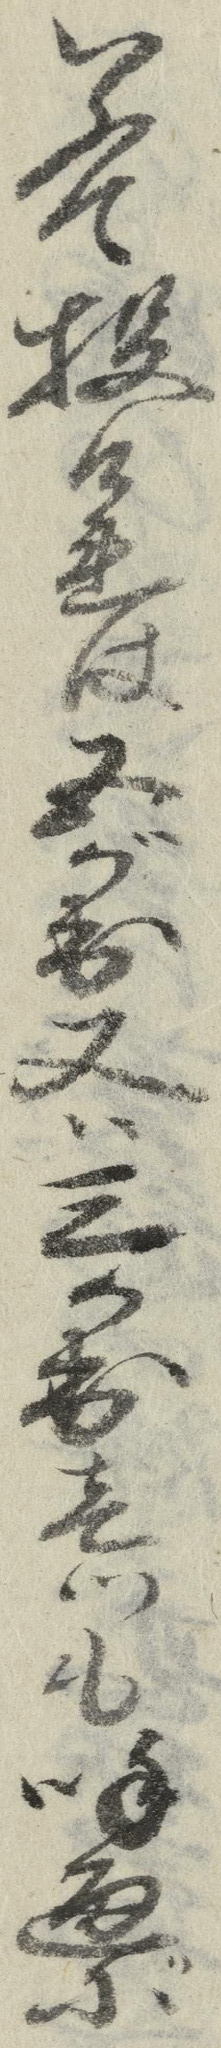いふて投けれは五が出又は三か出壱つも呼通
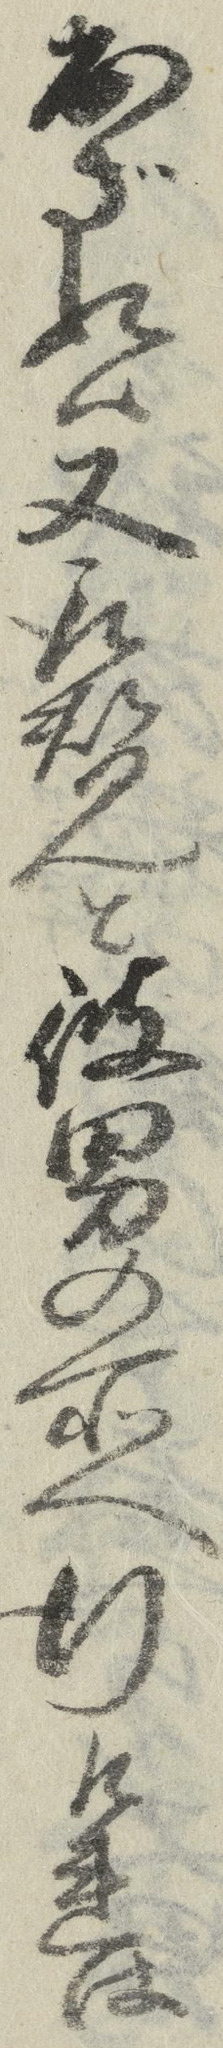出ざれは又取替んと彼男の所へ行けれは
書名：浅間大焼騒動記　上
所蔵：東京大学地震研究所図書室 Earthquake Research Institute Library, The University of Tokyo, JAPAN
